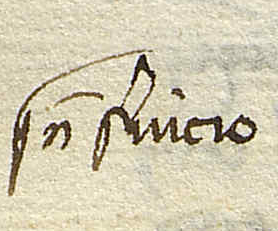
ſn* ſ*uicio
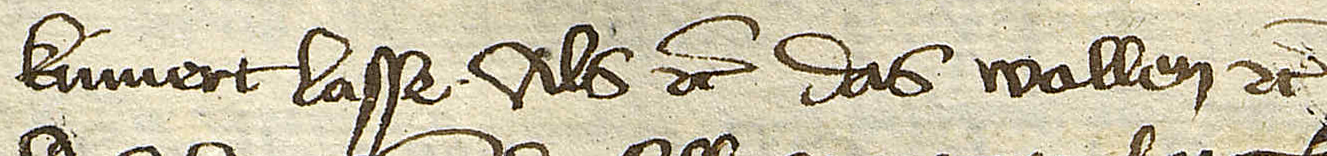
kümert laſſe . Als ec* das wollen ec*
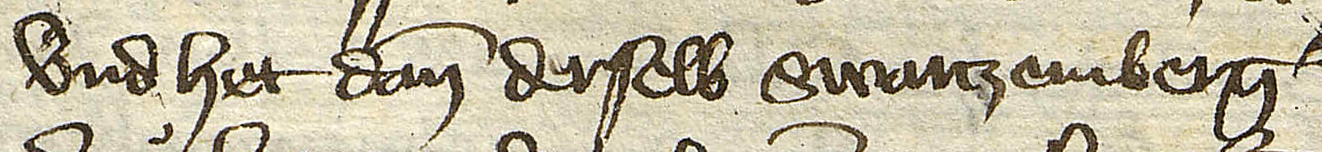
Vnd het dan* derſelb Swarcʒemberg*
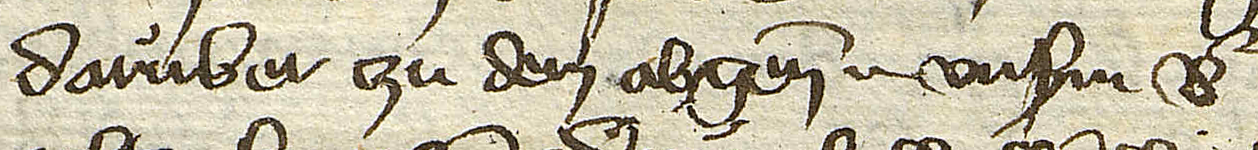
darüber cʒu dem obgen* ~ vnſ*m B*
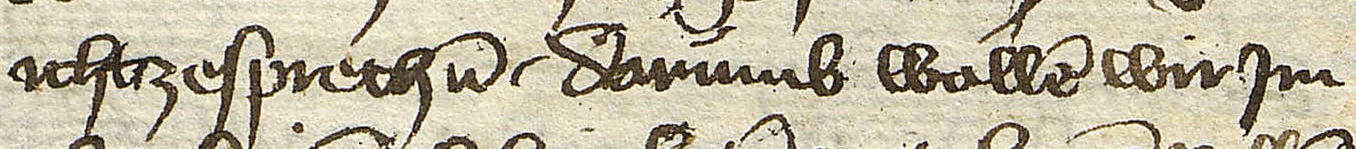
icht cʒeſprechn* / darümb wolle* wir Im
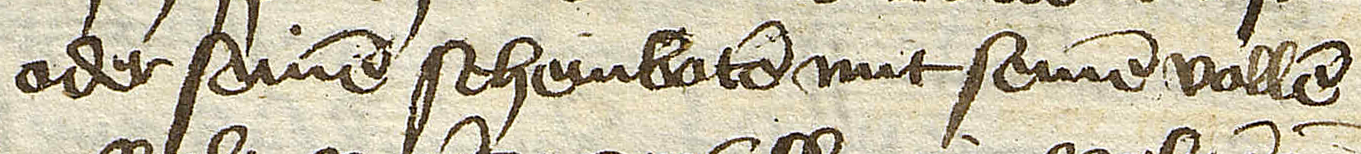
oder ſeine* ſcheinbote* mit ſeine* volle*
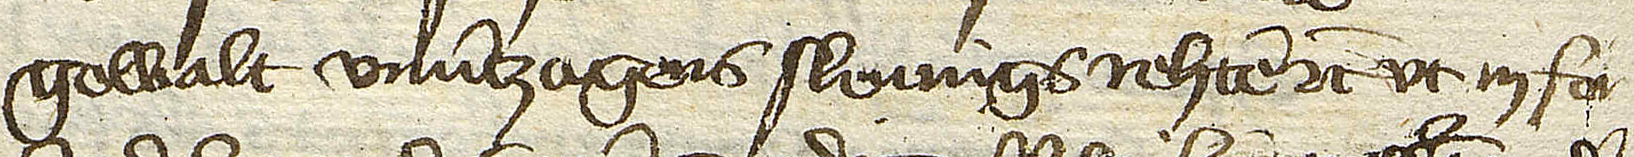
gewalt vnu*cʒogens ſleunigs rehte* ec* vt in for*
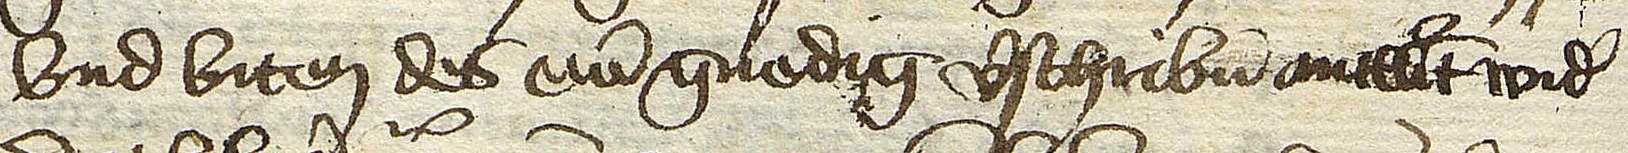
vnd biten des ew* gnedig v*ſchribn* antw*t wid*
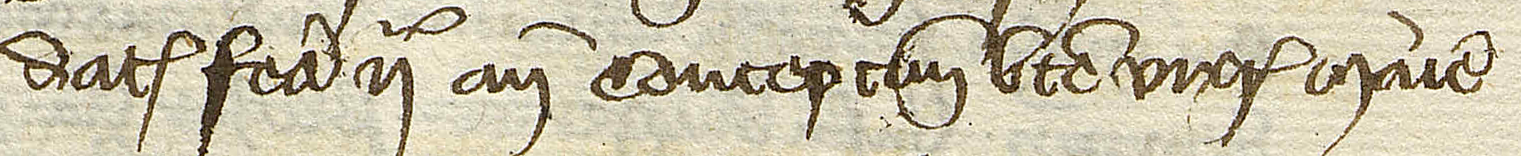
dat* fe*a ii* an* Concepcon* bte* virg* Maie*
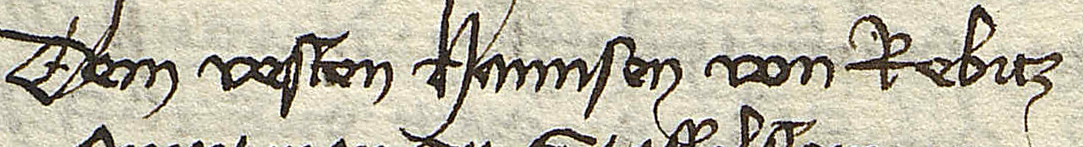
Dem veſten Hannſen von Rebicʒ
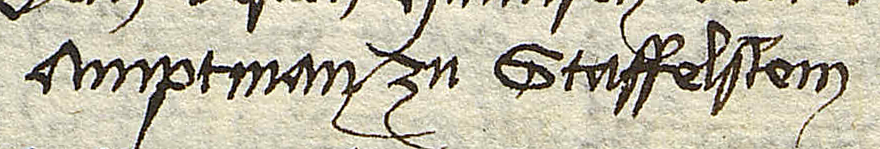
amptman ʒu Staffelſtein
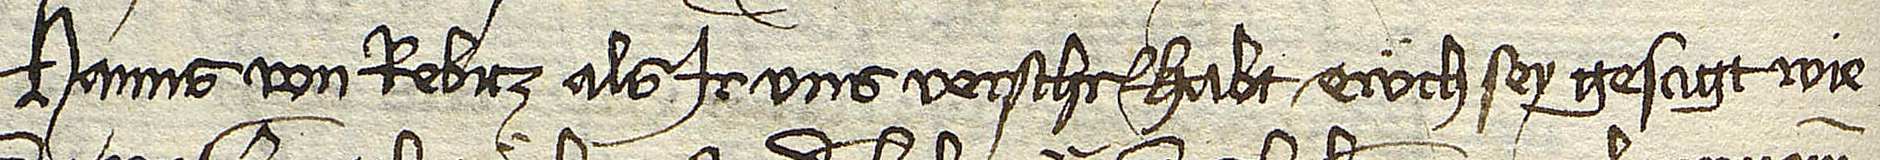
Hanns von Rebicʒ als Ir vns verschr* habt / eẅch ſey geſagt wie
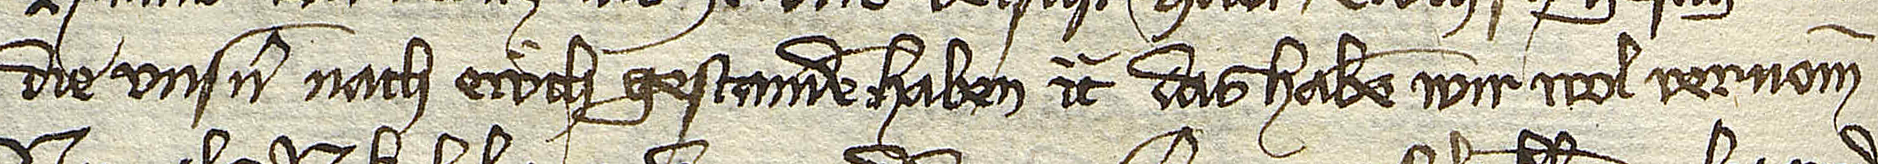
die vnſ*n nach eẅch geſtande* haben ec* das habe* wir wol vernom*
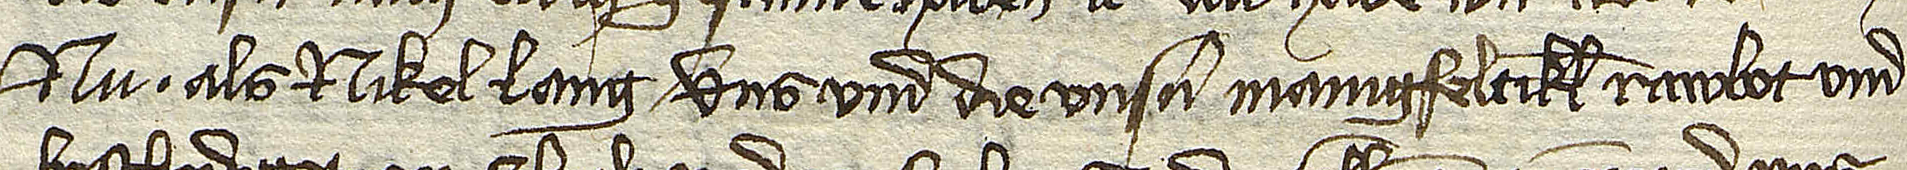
Nu . als Nikel lang / Vns vnd die vnſ*n manigfeltikl* rawbot vnd
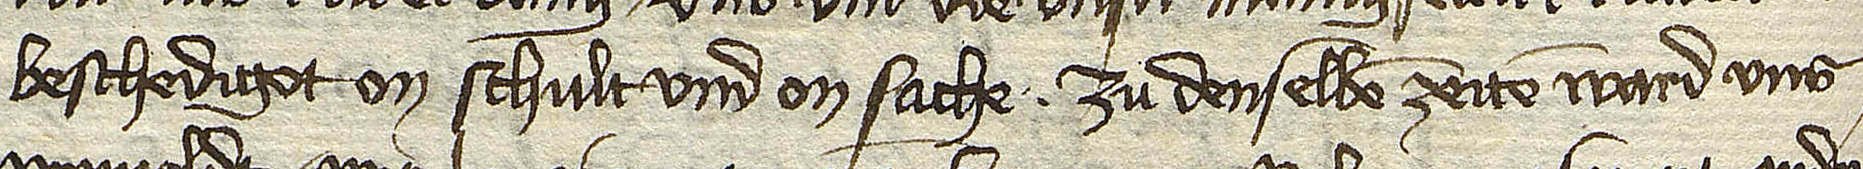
beſchedigot on ſchult vnd on ſache . Ʒu denſelbe* ʒeite* ward vns
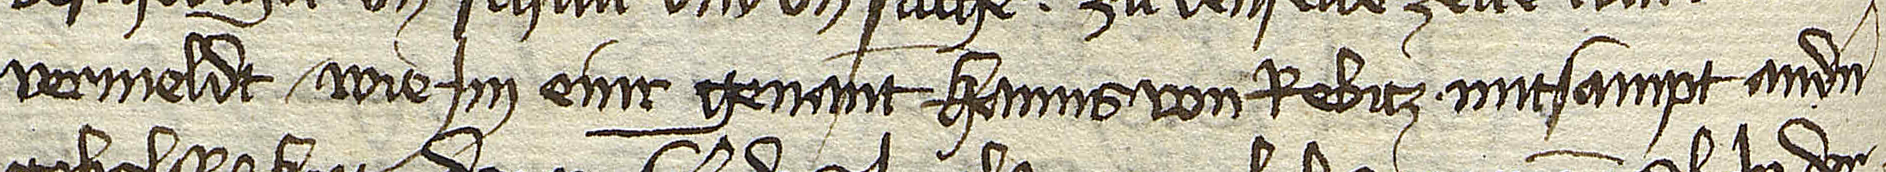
vermeldt / wie Im einr genant* Hanns von Rebicʒ mitſampt and*n
